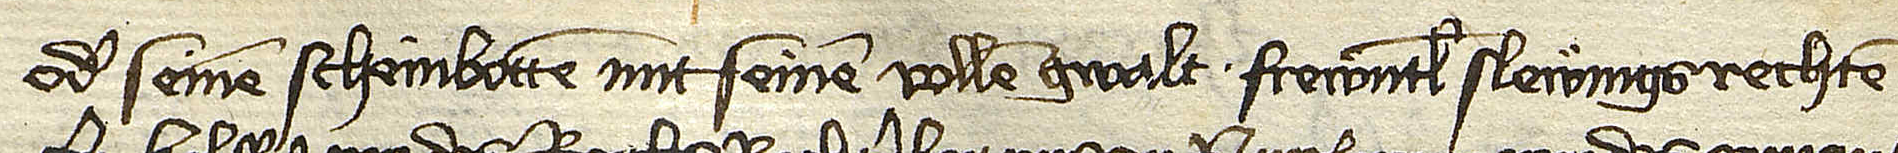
od* ſeine* ſcheinbotte* mit ſeine* volle* gwalt . frewntl* ſlewnigs rechte*
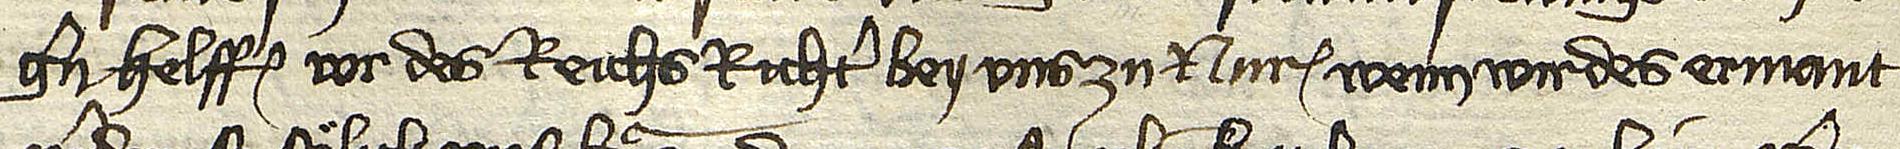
g*n helff* vor des Reichs Richt* bey vns ʒu Nur* wenn wir des ermant
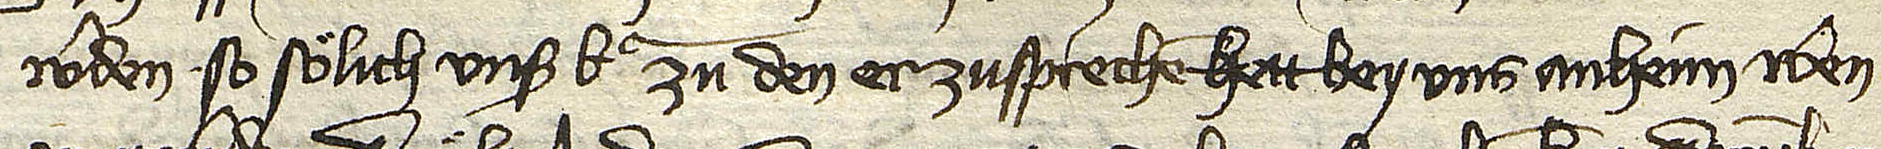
w*den . ſo ſölich vnſ* b* ʒu den er ʒuſpreche* hett bey vns anheim we*n
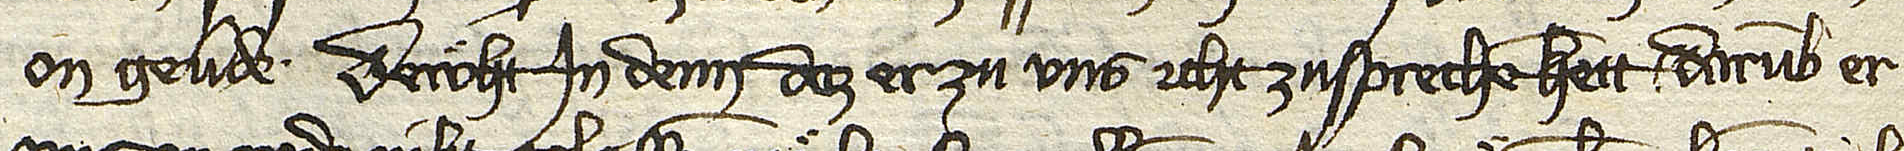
on geu*de . Dewcht In denn daʒ er ʒu vns icht ʒuſpreche* hett / Daru*b er
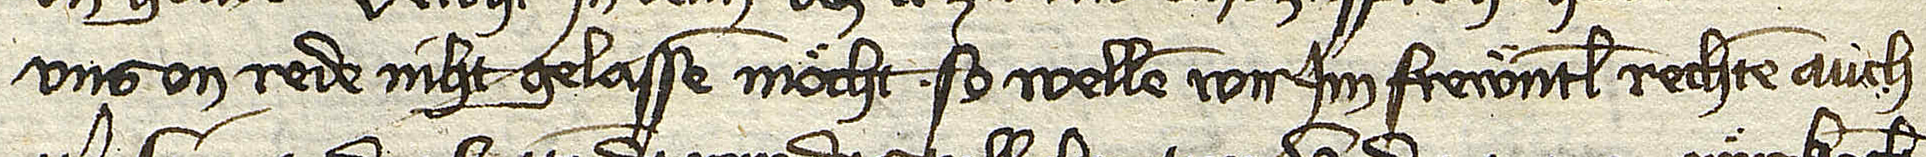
vns on rede niht gelaſſe* möcht . ſo welle* wir Im frewntl* rechte* auch
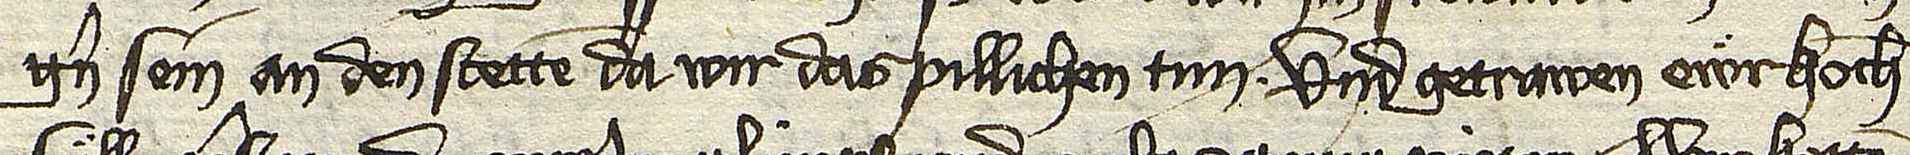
g*n ſein an den ſtette* da wir das pillichen tun . Vnd getrawen ewr hoch*
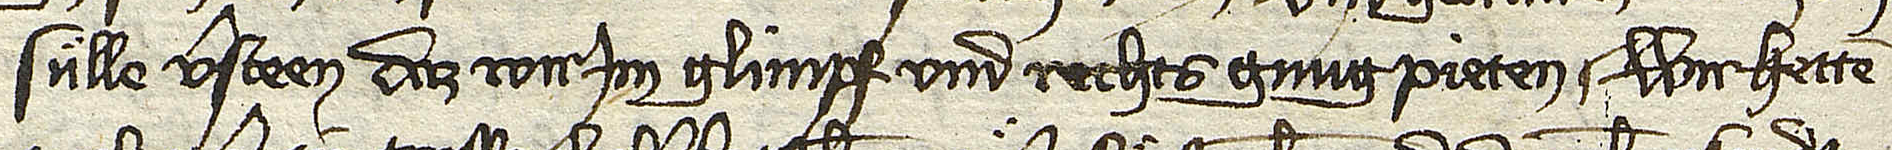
ſülle v*ſteen daʒ wir Im glimpf vnd rechts gnug pieten / Wir hette*
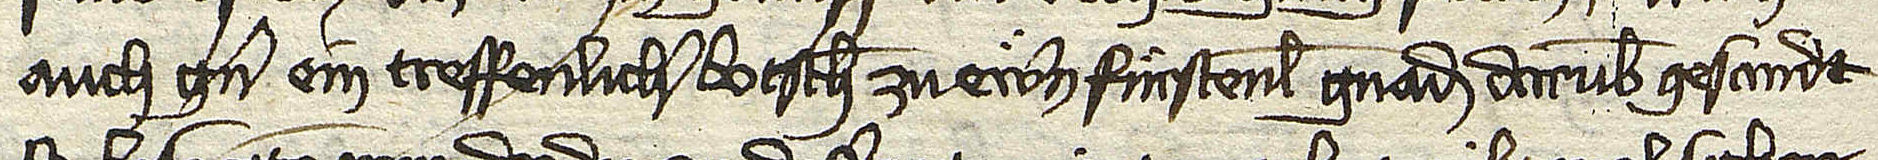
auch g*n ein treffenlich* botſch* ʒu ew*n fürſtenl* gnad* daru*b geſandt
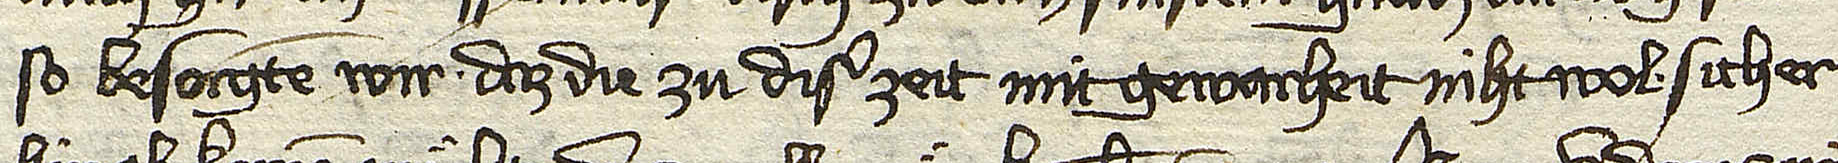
ſo beſorgte* wir . daʒ die ʒu diſ* ʒeit mit gewarheit niht wol . ſicher
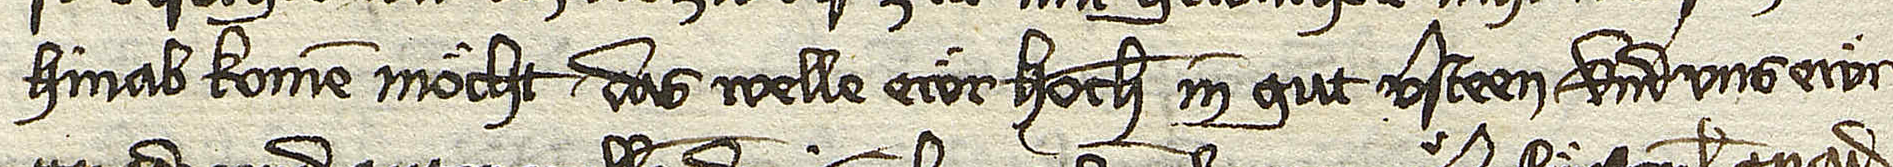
hinab kome* möcht / das welle ewr hoch* in gut v*ſteen / Vnd vns ewr
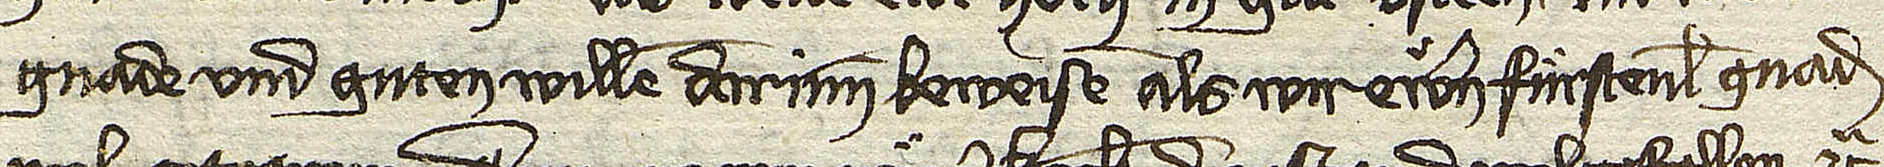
gnade vnd guten wille* darinn beweiſe* als wir ew*n fürſtenl* gnad*
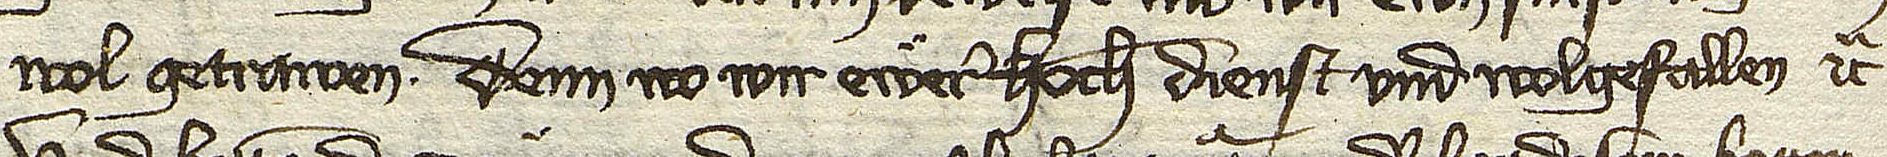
wol getrawen . Denn wo wir ewer* hoch* dienſt vnd wolgefallen ec*
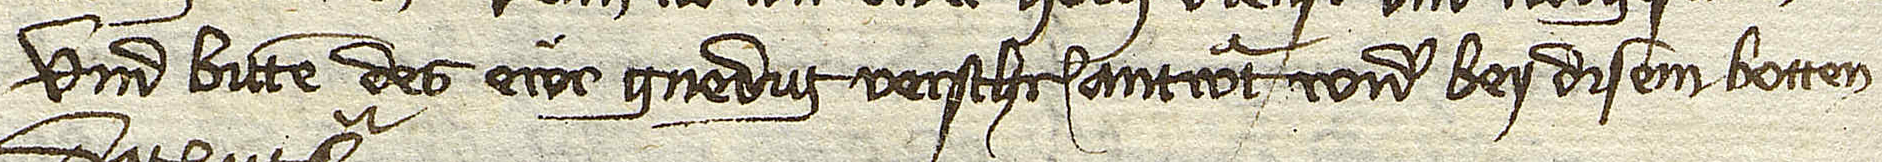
Vnd bitte* des ewr gnedig verſchr* antw*t wid* bey diſem botten
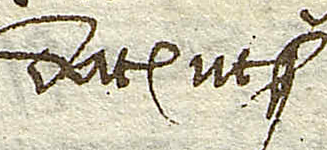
Dat* ut ſ*
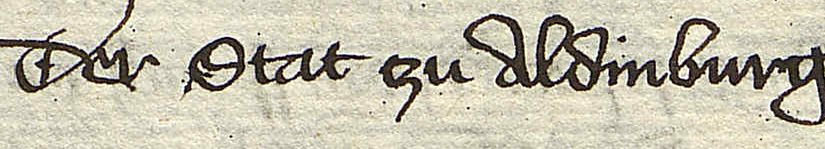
Der Stat cʒu Aldinburg
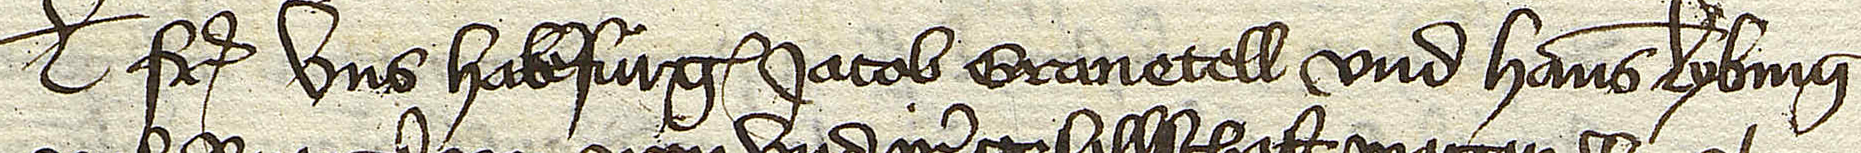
L* fr* Vns habe* fürg* Iacob Granetell vnd Hans* Lybing
